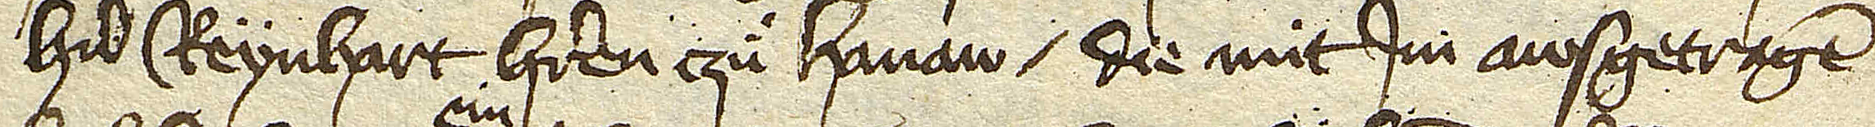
hn* Reynhart hr*en cʒü Hanaw / die mit Im awſgetrage*
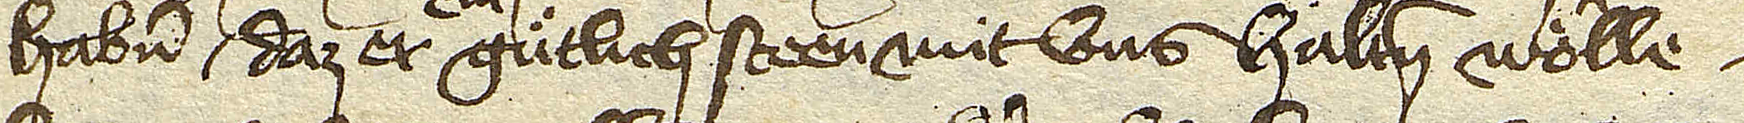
habn* / daʒ er gütlich ſteen mit vns haltn* wölle /
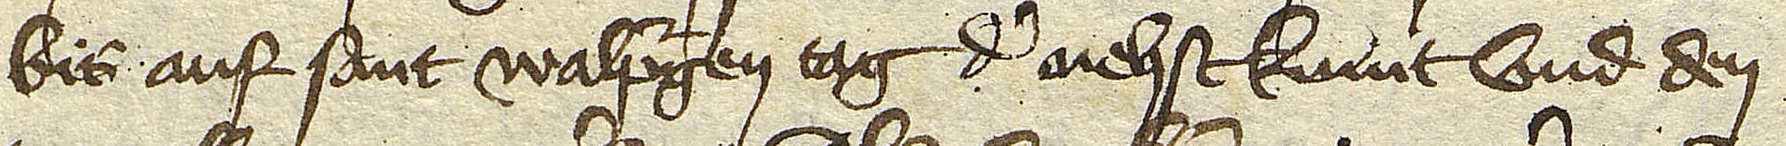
bis auf ſant walp*gen tag d* nehſt kumt vnd den
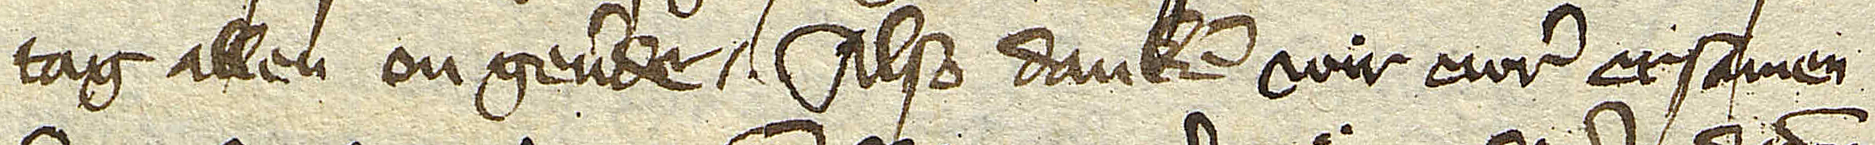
tag allen on geu*de / . Alſo danke* wir ewr* erſamen
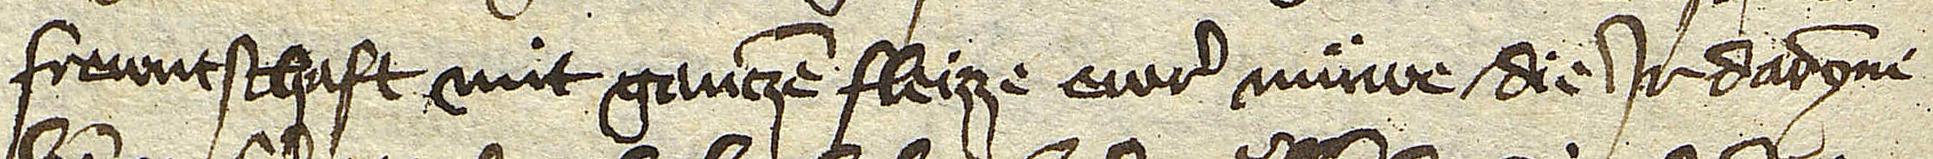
frewntſchaft mit gancʒe* fleiʒʒe ewr* müwe / die Ir daryne*
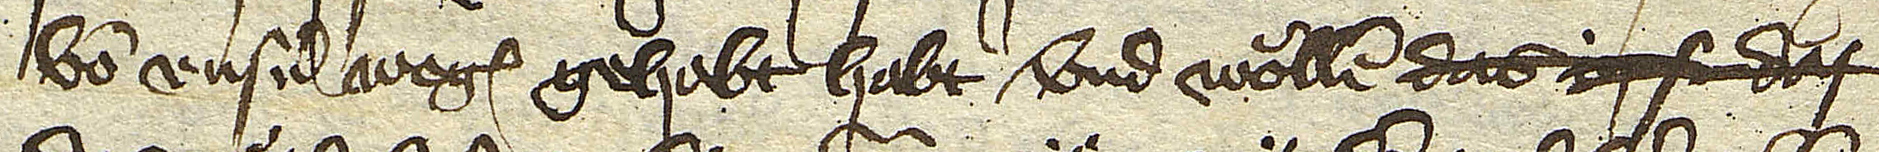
vo* vnſn* weg* gehabt habt / vnd wölle* das in ſo daſ
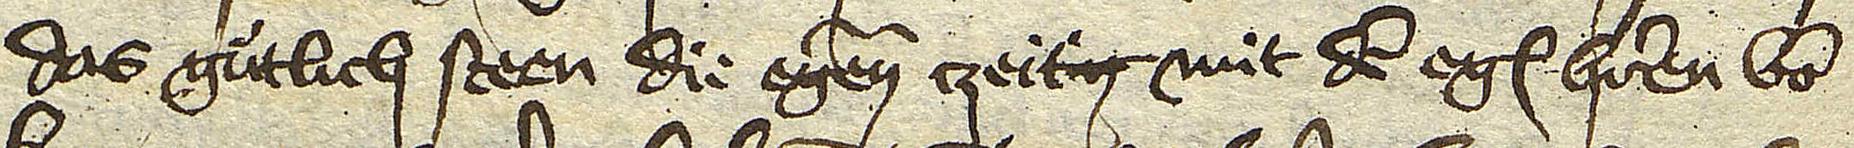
das gütlich ſteen die egen* cʒeitn mit d* eg* hr*en vo*
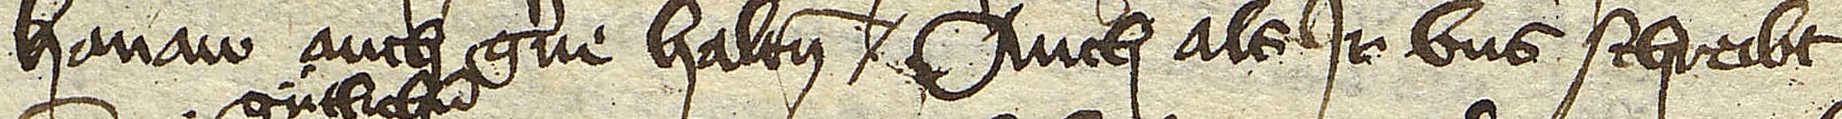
hanaw auch g*ne haltn* / Auch als Ir vns ſchreibt
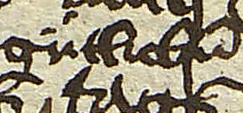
gütlichn*
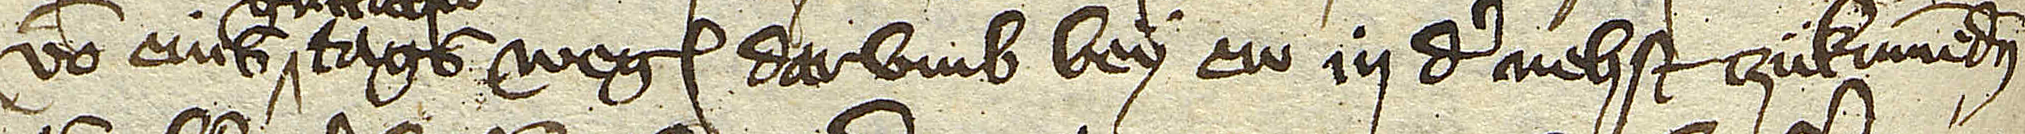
vo* eins tags weg* darvmb bey ew in d* nehſt cʒükumedn*
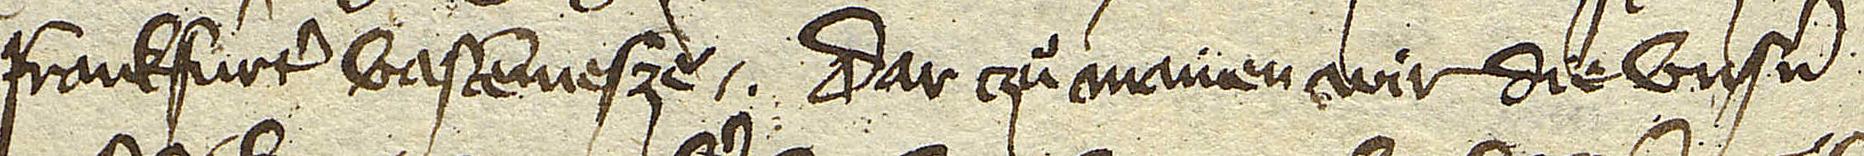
Frankfurt* vaſte*meſʒe / . Dar cʒü mainen wir die vnſn*
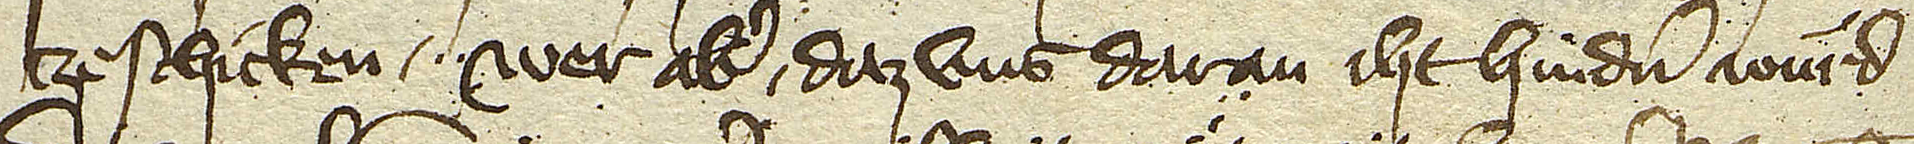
cʒeſchicken / . . wer ab* / daʒ vns daran iht hindn* würd
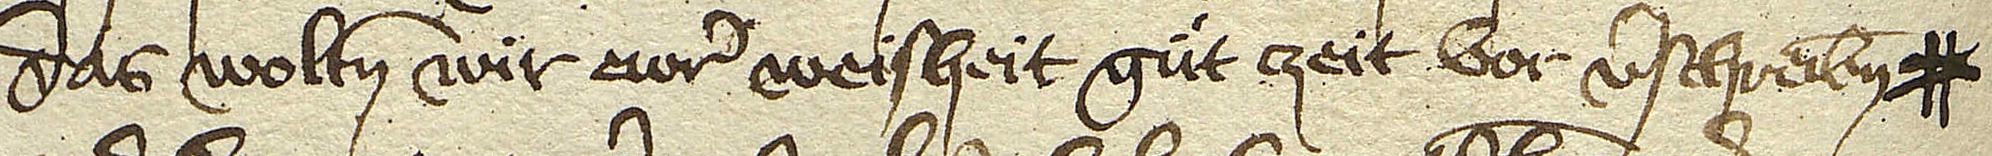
Das woltn* wir ewr* weiſheit güt cʒeit vor v*ſchreibn*
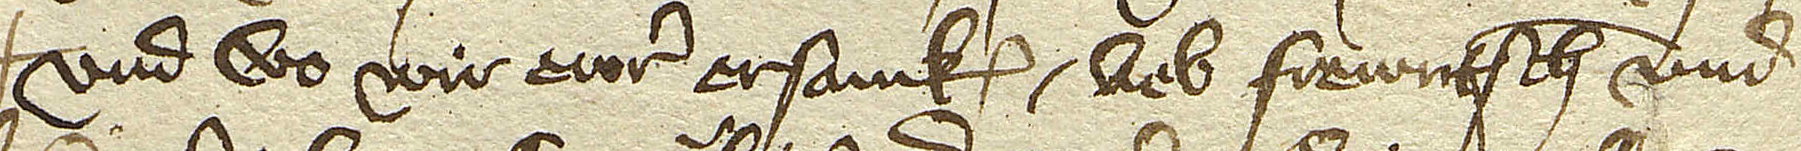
vnd wo wir ewr* erſamk* / lieb frewntſch* vnd
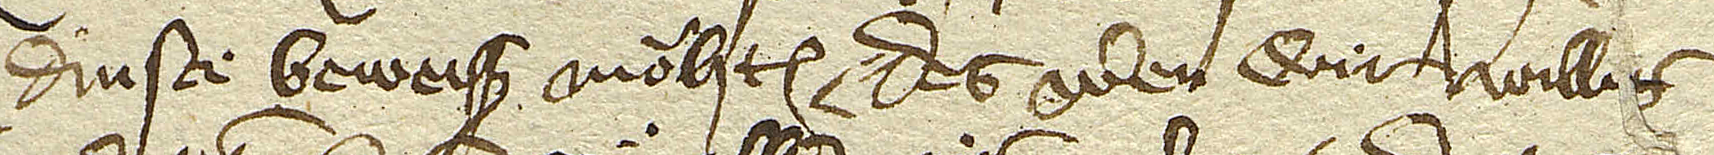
dinſte beweiſ* möht* / des w*en wir willig*
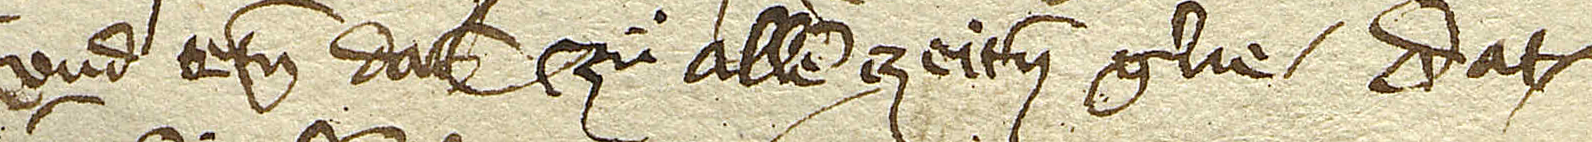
vnd tetn* das cʒü alle* cʒeitn* g*ne / Dat*
